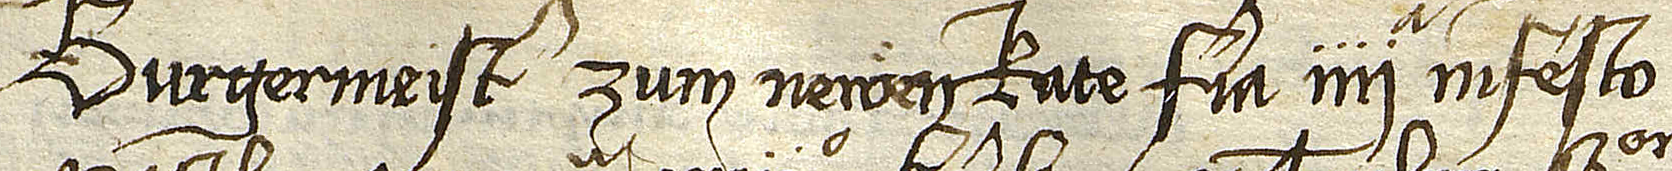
Burgermeiſt* ʒum newen Rate fia* iiii* in Feſto
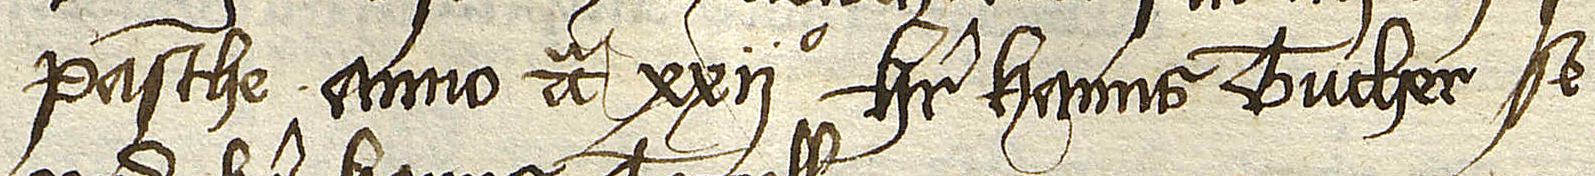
Paſche* . anno ec* xxii* H*r Hanns Tucher ſe*
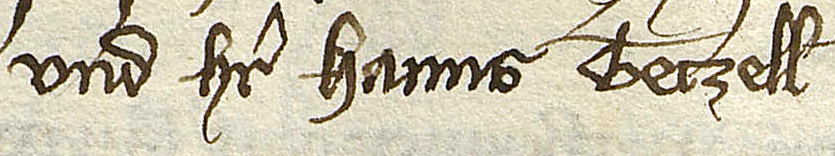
vnd h*r hanns Tecʒell
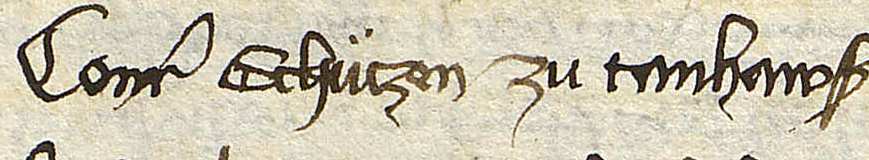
Conr* Schücʒen ʒu tanhawſ*
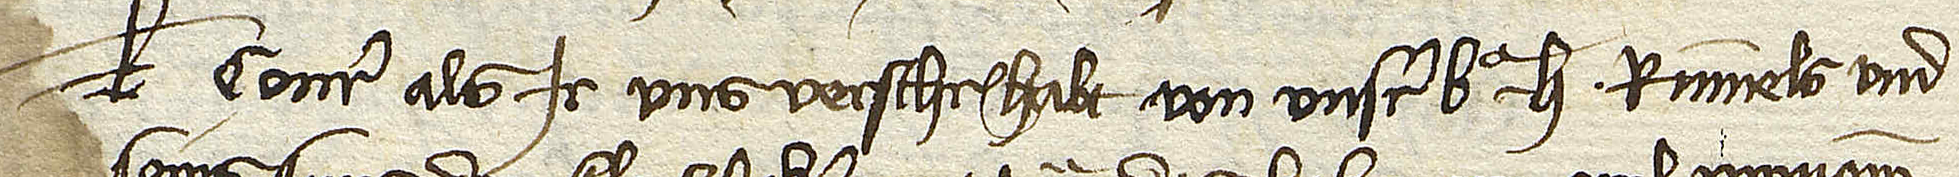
L* Conr* als Ir vns verſchr* habt von vnſ*r b* h* . Rumels* vnd
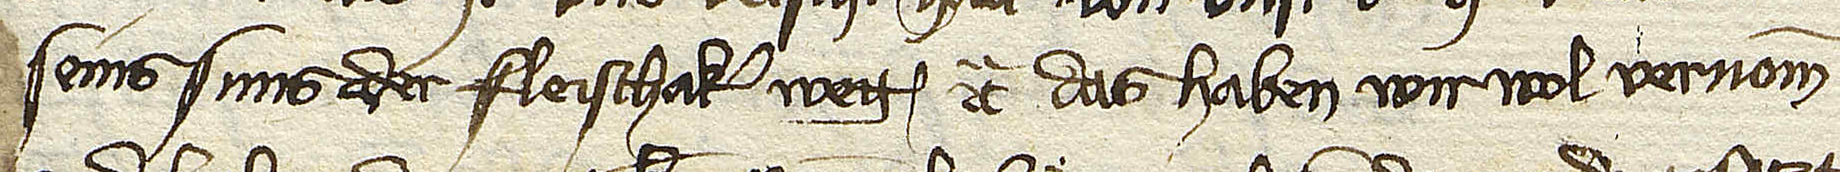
ſeins ſuns der fleiſchak* weg* ec* das haben wir wol vernom*
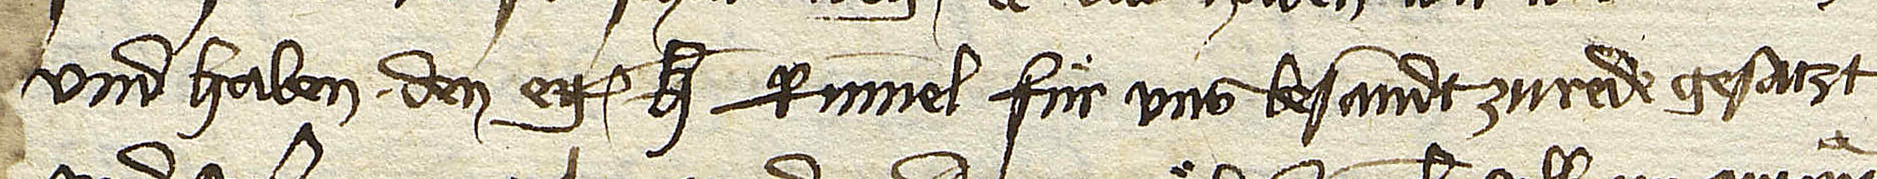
vnd haben . den eg* H* Rumel* für vns beſandt ʒurede geſacʒt
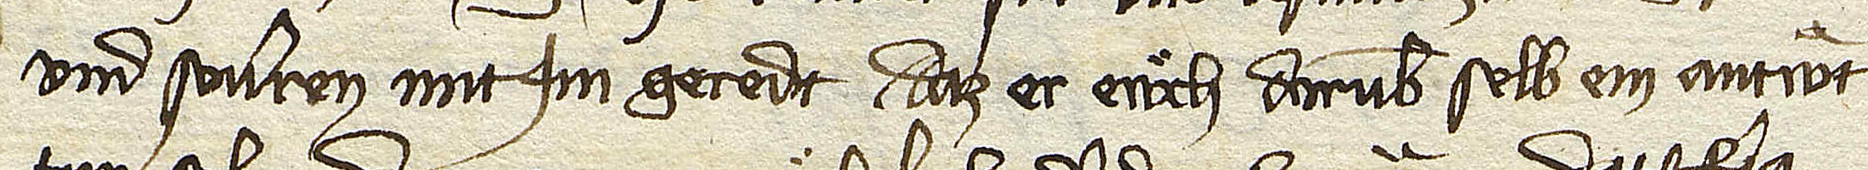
vnd ſou*ren mit Im geredt / daʒ er ewch daru*b ſelb ein antw*t
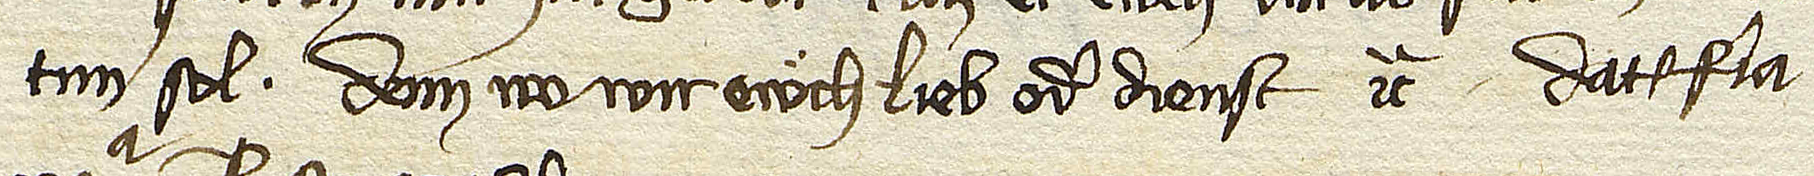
tun ſol . Denn wo wir ewch lieb od* dienſt ec* / Dat* fia*
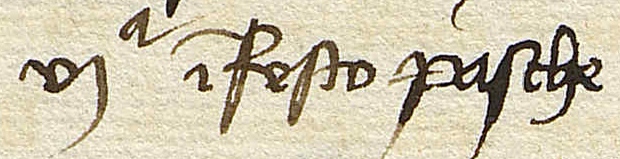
vi* i* Feſto Paſche
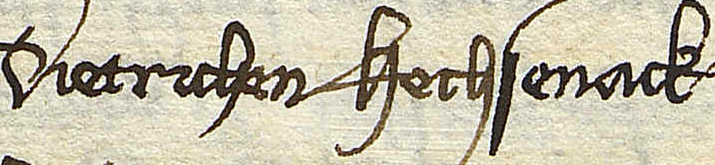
Dietrichen Hechſenack*
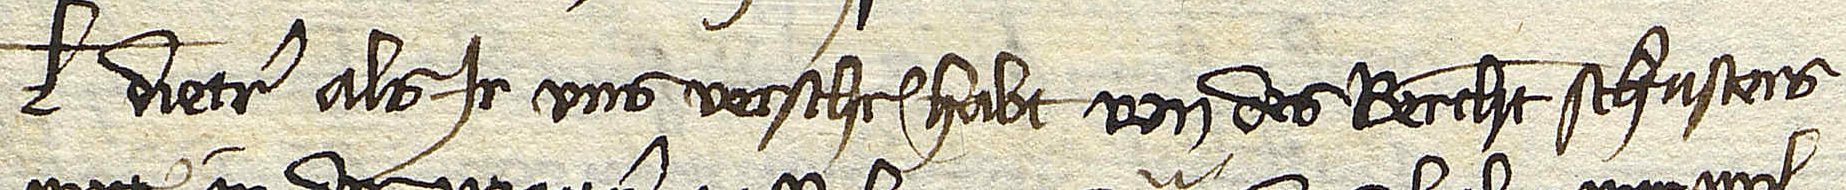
L* dietr* als Ir vns verſchr* habt von des Bercht* ſchuſters
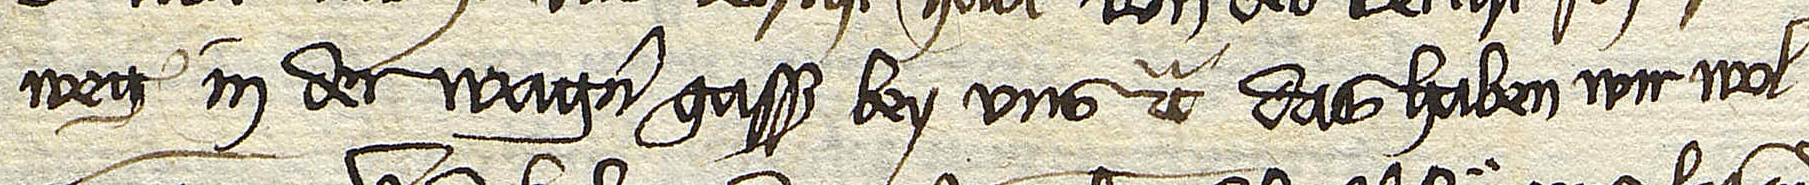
weg* in der wag*n gaſſ* bey vns ec* das haben wir wol
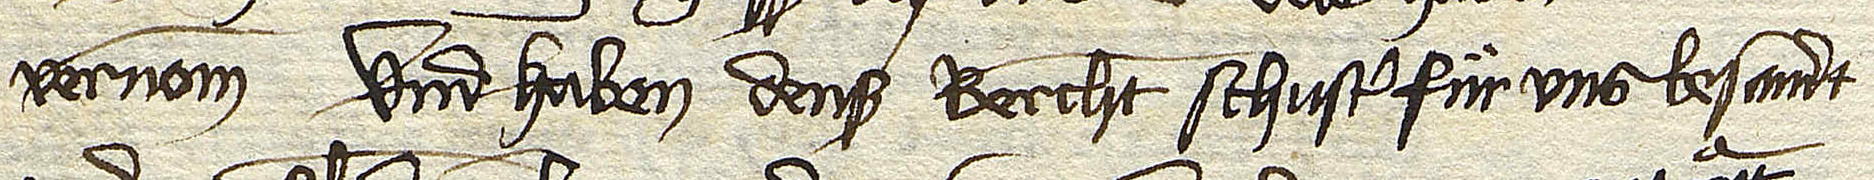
vernom* Vnd haben denſ* Bercht* ſchuſt* für vns beſandt
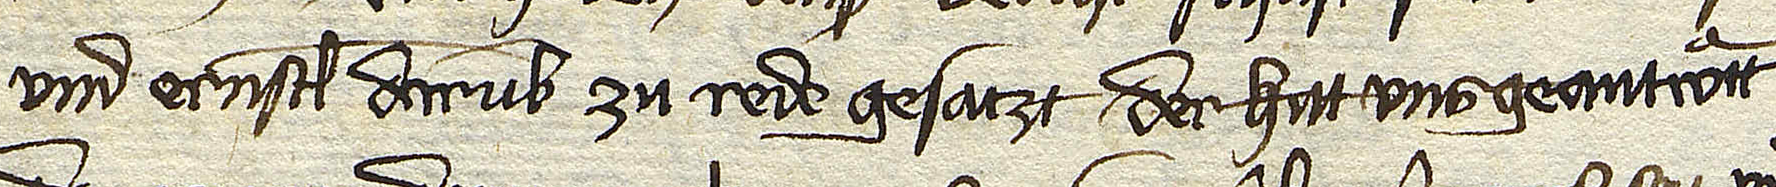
vnd ernſtl* daru*b ʒu rede geſacʒt / Der hat vns geantw*tt
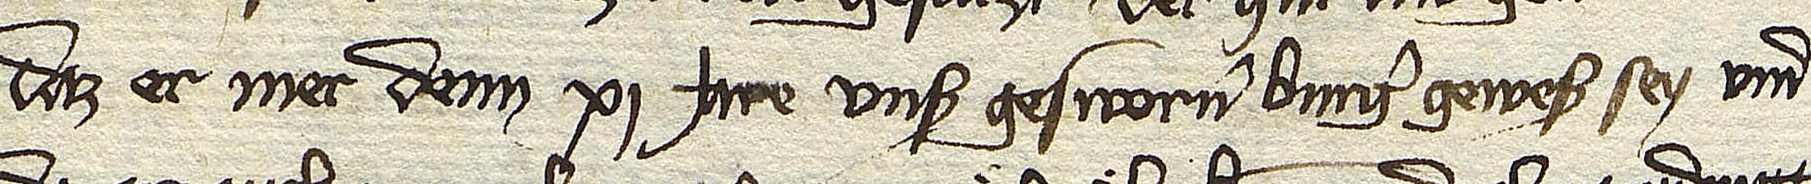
Daʒ er mer denn xi Iare vnſ* geſwor*n burg* geweſ* ſey vnd
